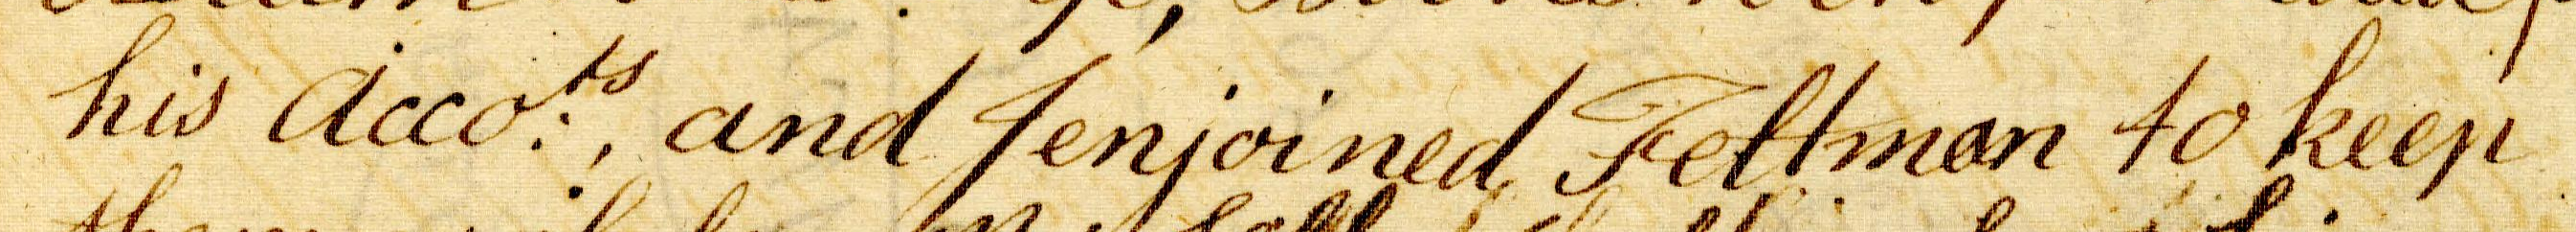his Acco:^ts, and I enjoined Feltmen to keep
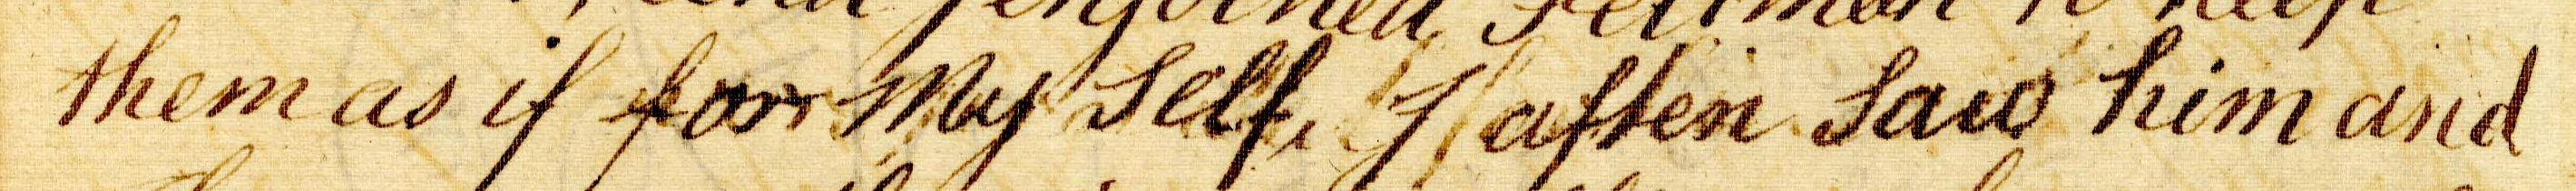them as if for My Self, I after saw him and
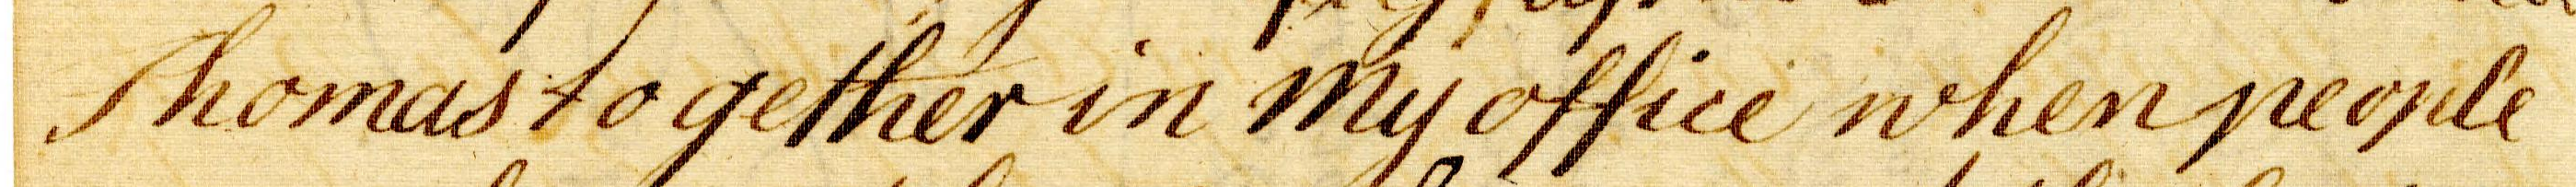Thomas together in My office when people
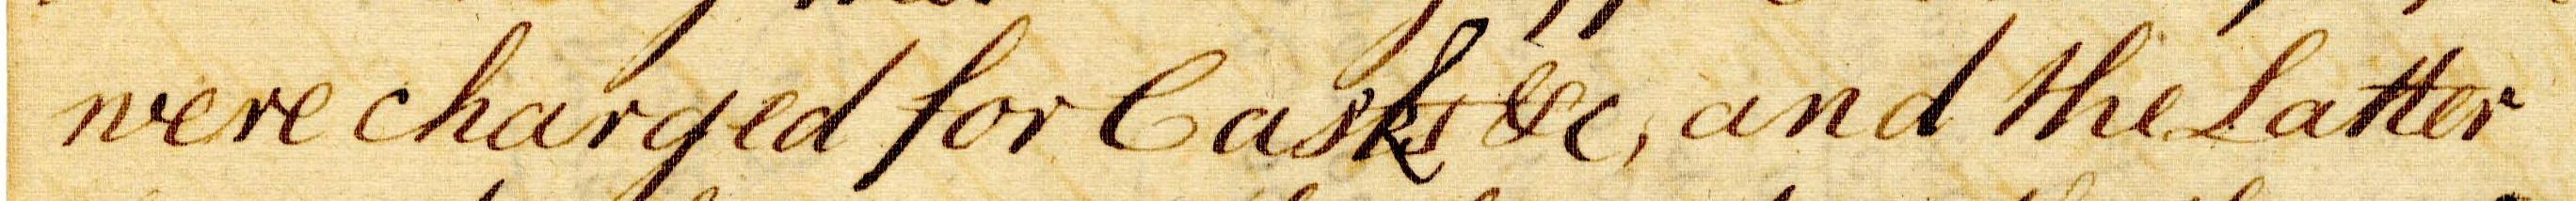were charged for Casks &c, and the Latter
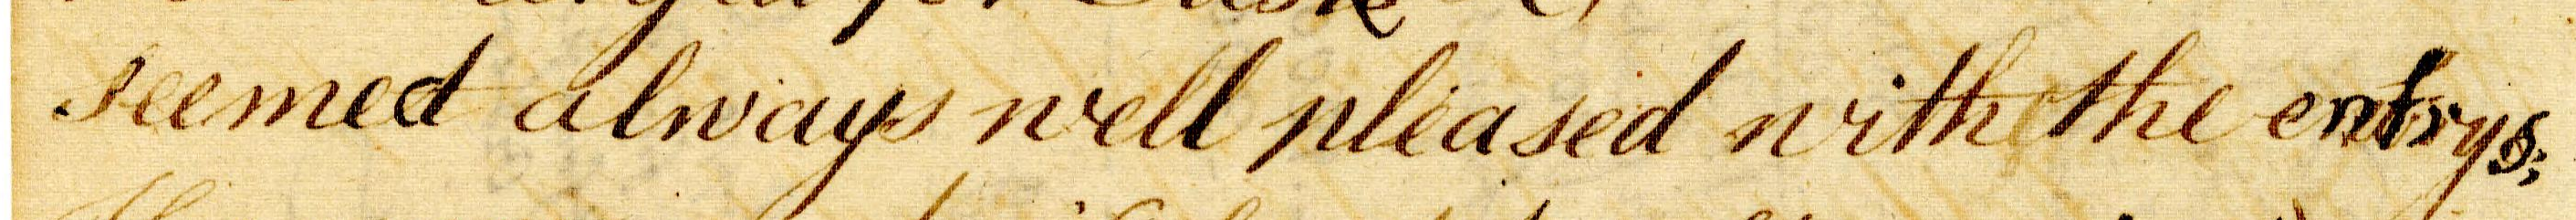seemed always well pleased with the entrys;
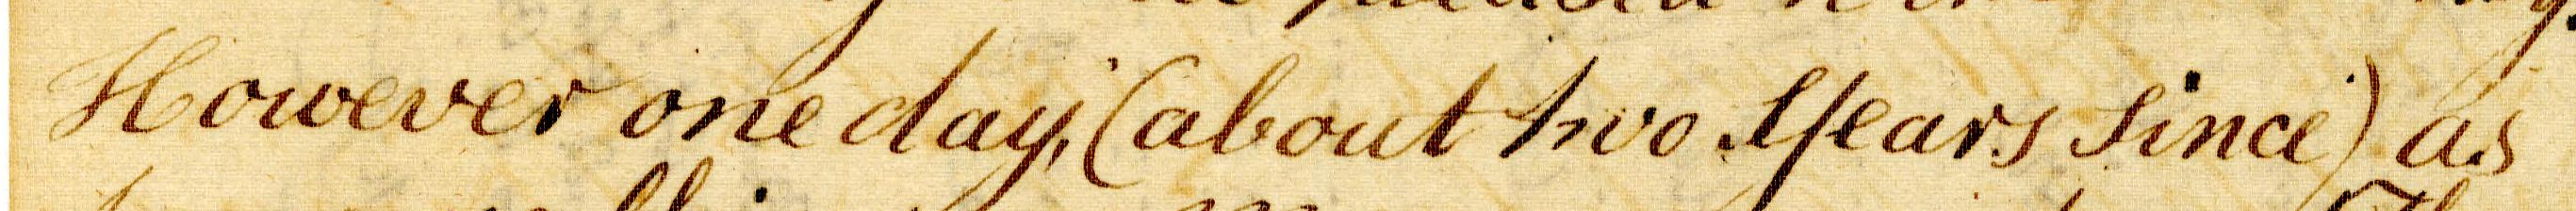However one day; (about two Years Since) as
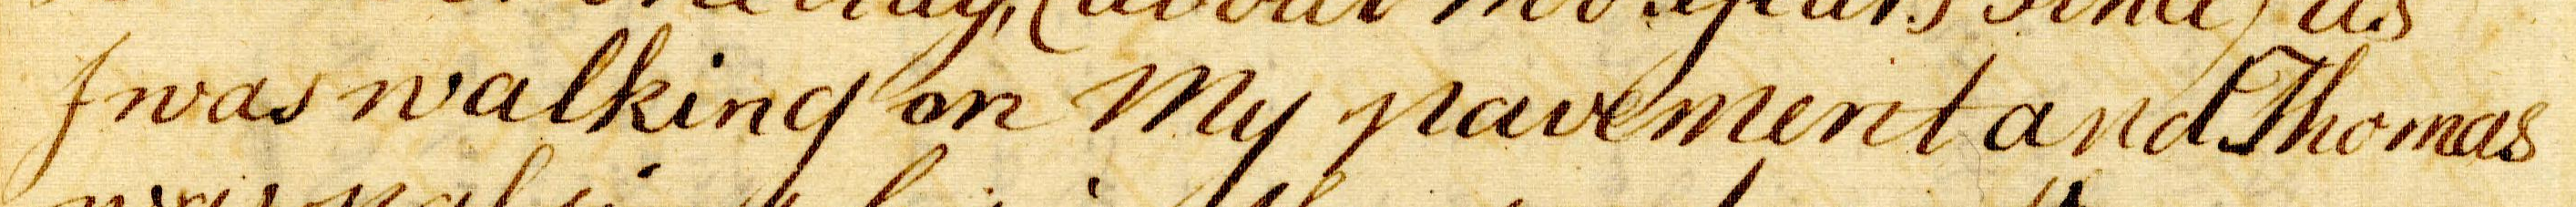I was walking on My pavement and Thomas
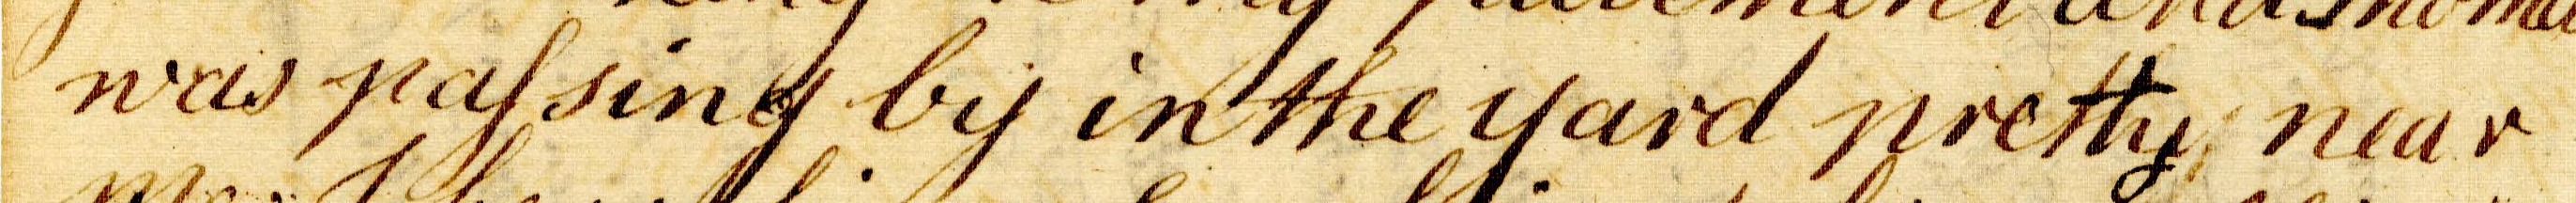was passing by in the yard pretty near
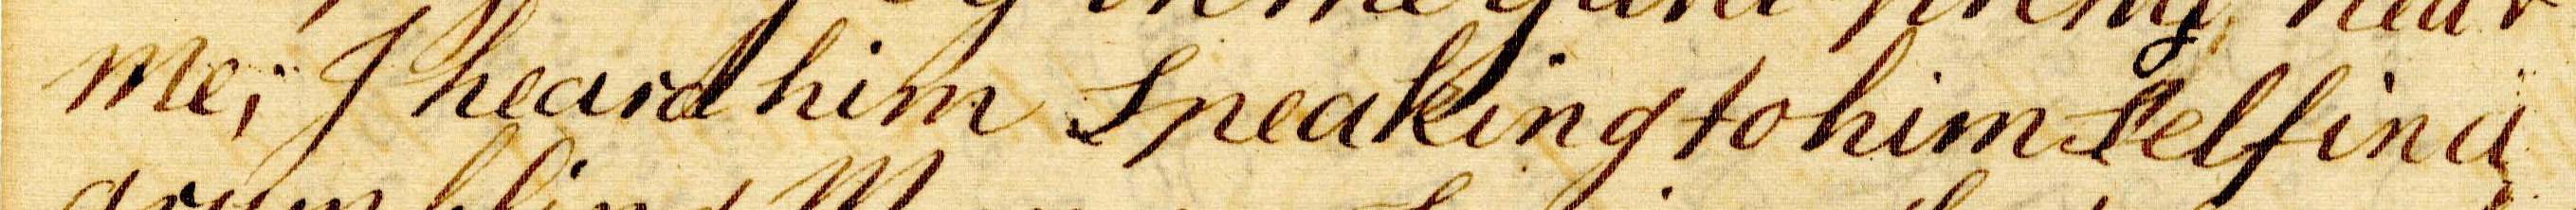Me; I heard him Speaking to himself in a
